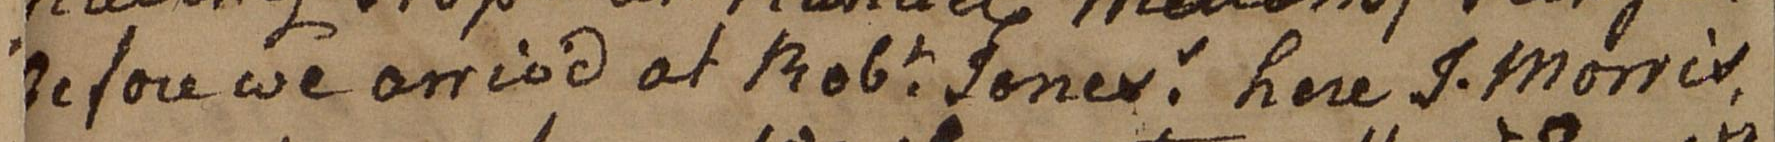before we arriv'd at Rob^t. Jones^s. here J. Morris,
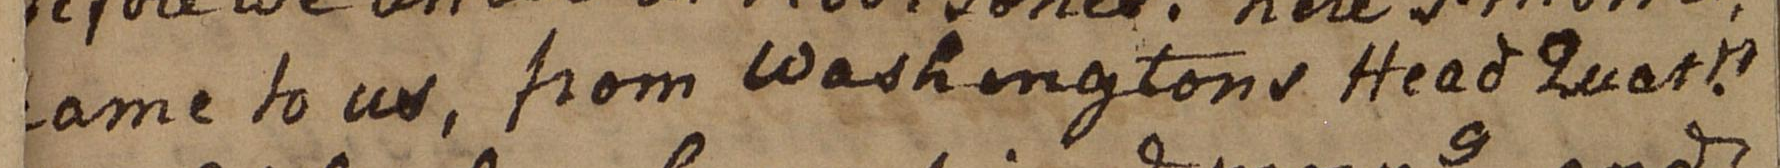came to us, from Washingtons Head Quar^ts.
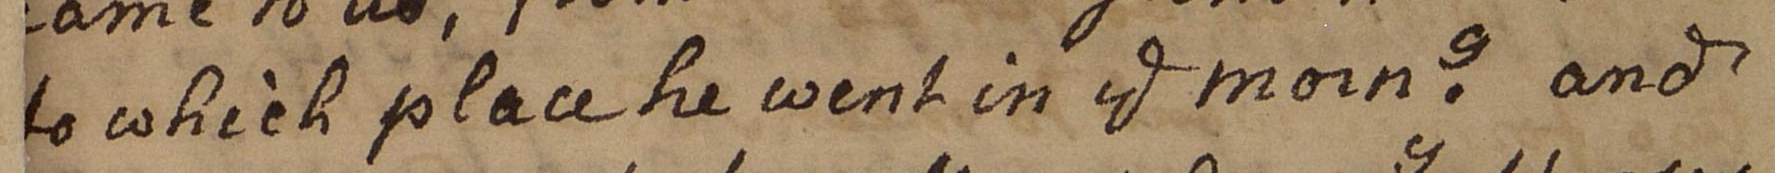to which place he went in y^e morn^g. and
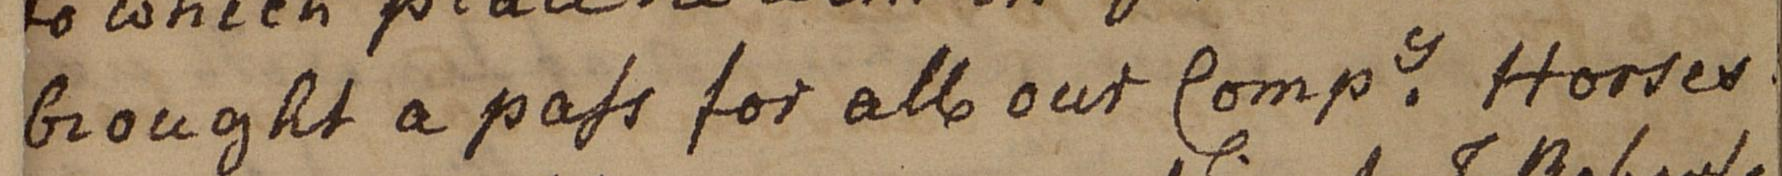brought a pass for all our Comp^y. Horses
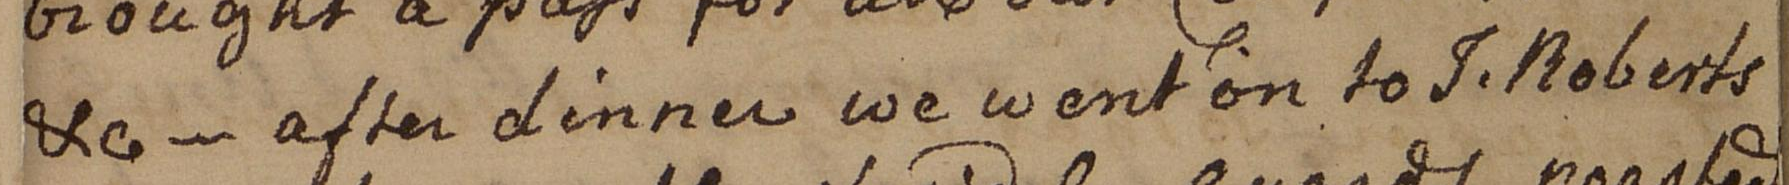&c- after dinner we went on to J. Roberts
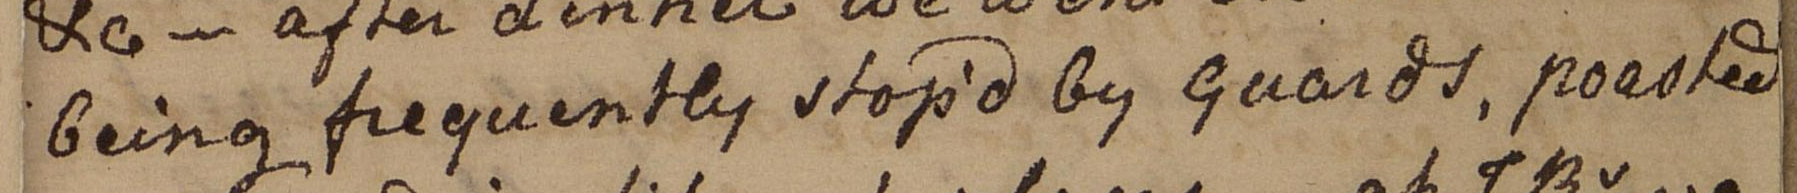being frequently stop'd by Guards, poasted
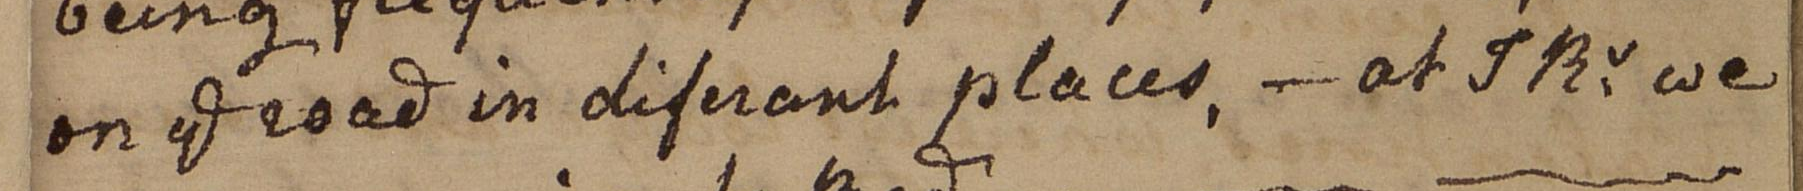on y^e road in diferant places,- at TR^s. we
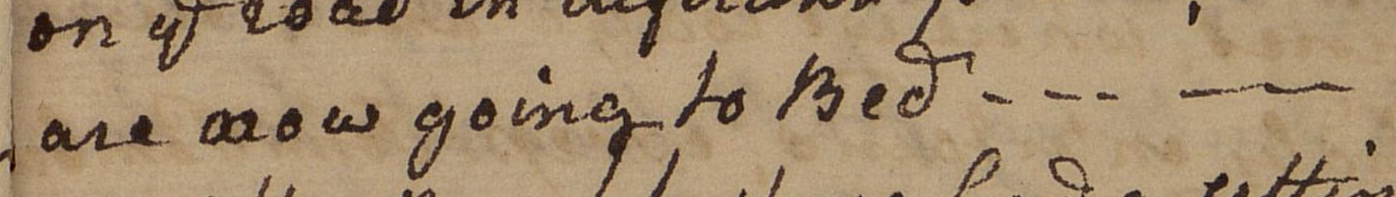are now going to Bed---
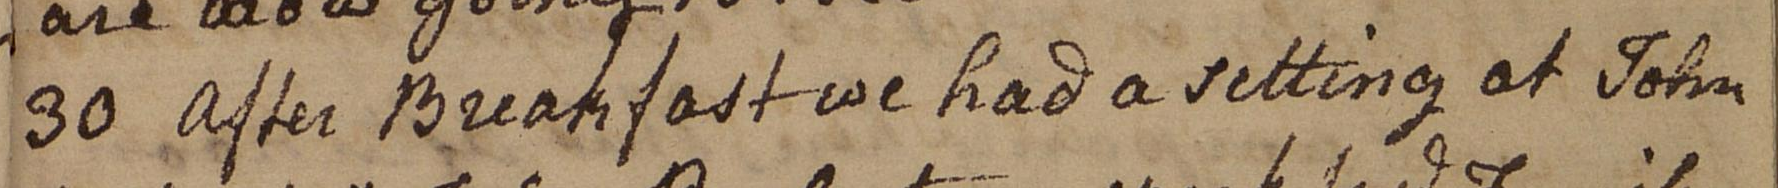30 after Breakfast we had a sitting at John
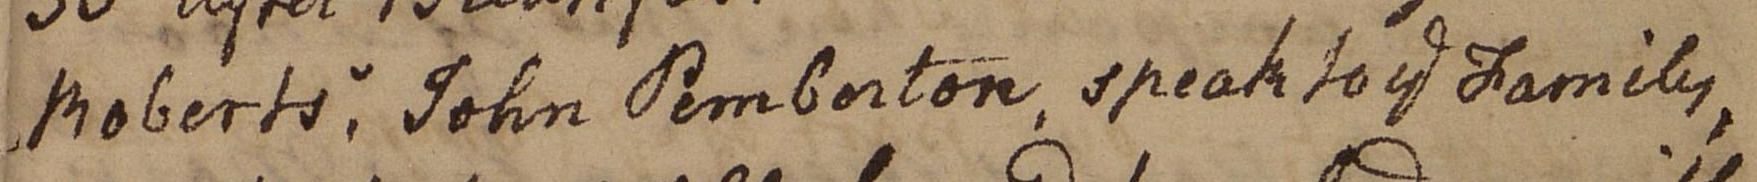Roberts^s. John Pemberton, speak to y^e Family
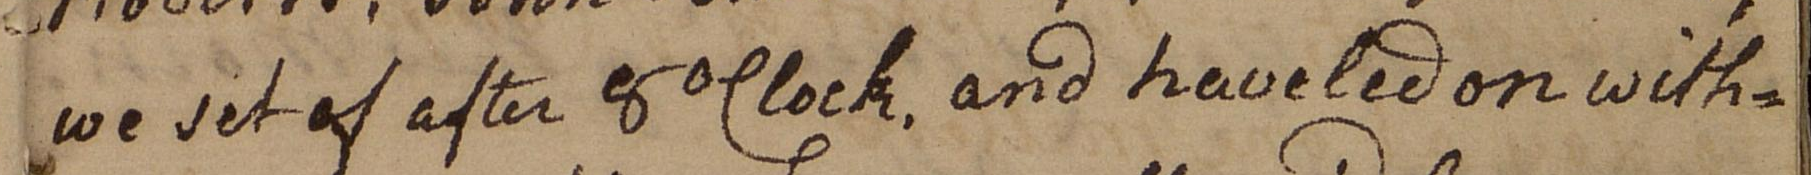we set of after 8 ^o Clock, and traveled on with-
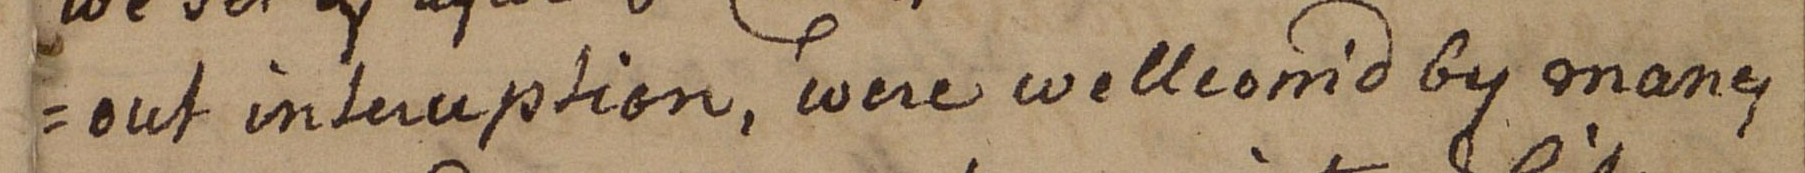-out interuption, were wellcom'd by many
